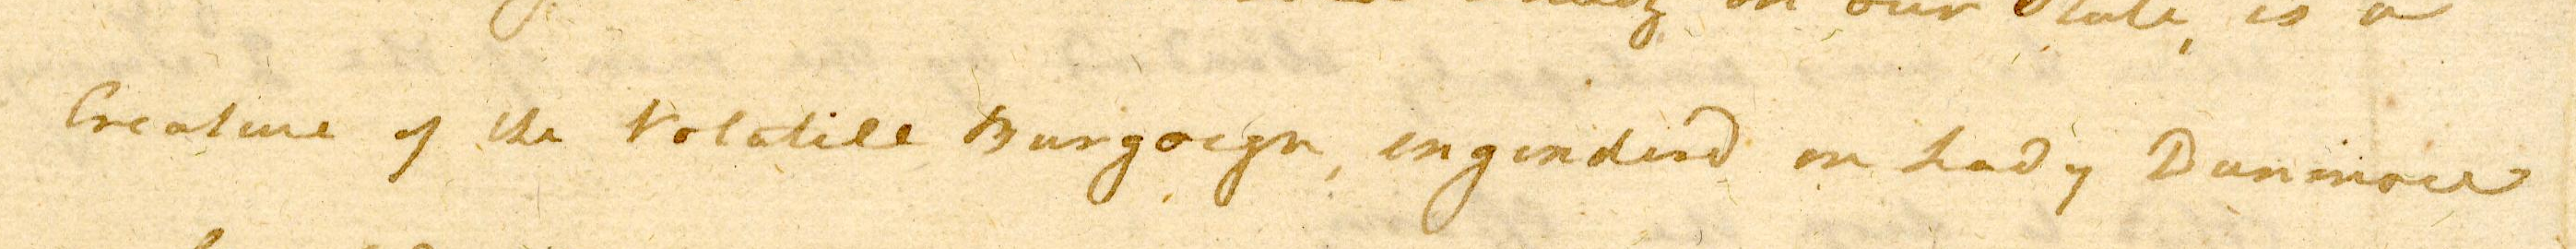Creature of the Volatile Burgoyne, engenderd on Lady Dunnow
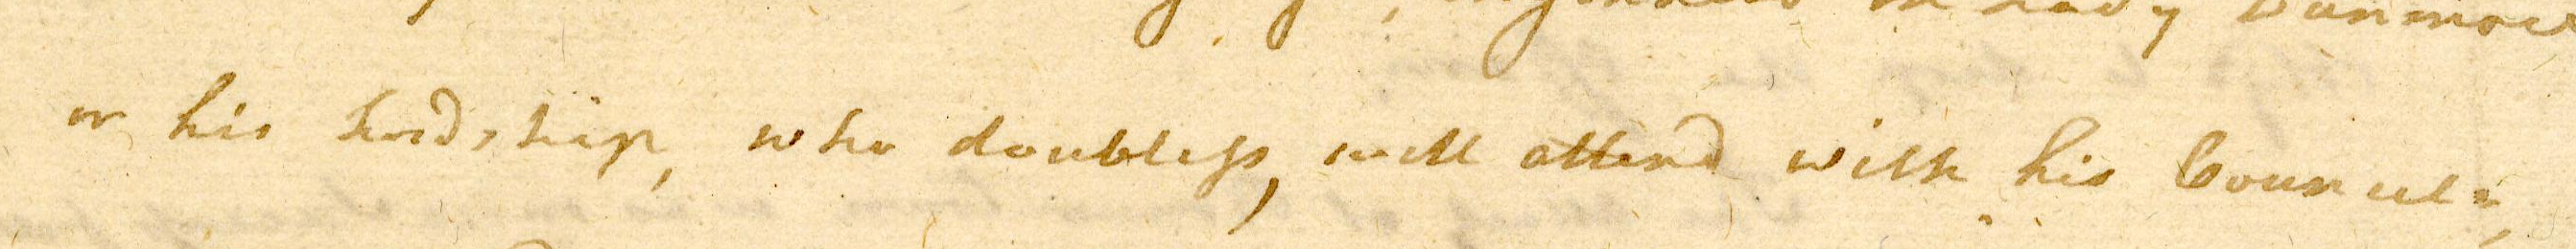or his lordship who doubtless will attend with his Councils,
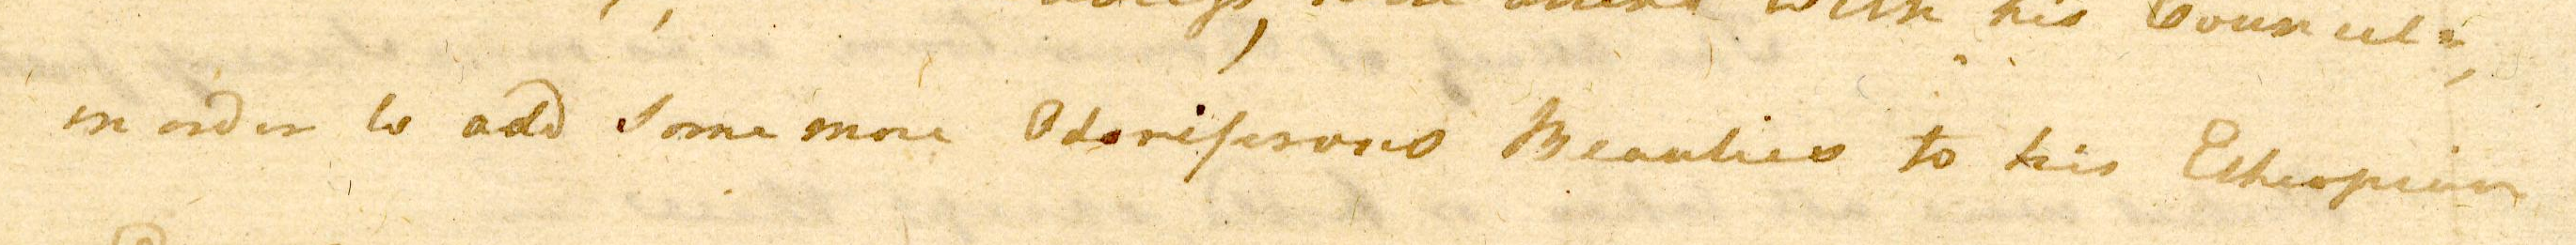in order to add some more [_______] Beauties to his Estopian
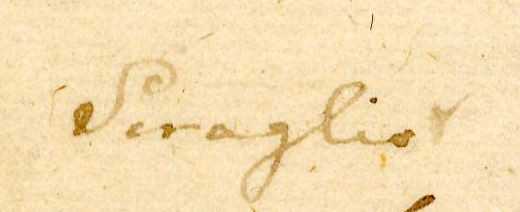Seraglies
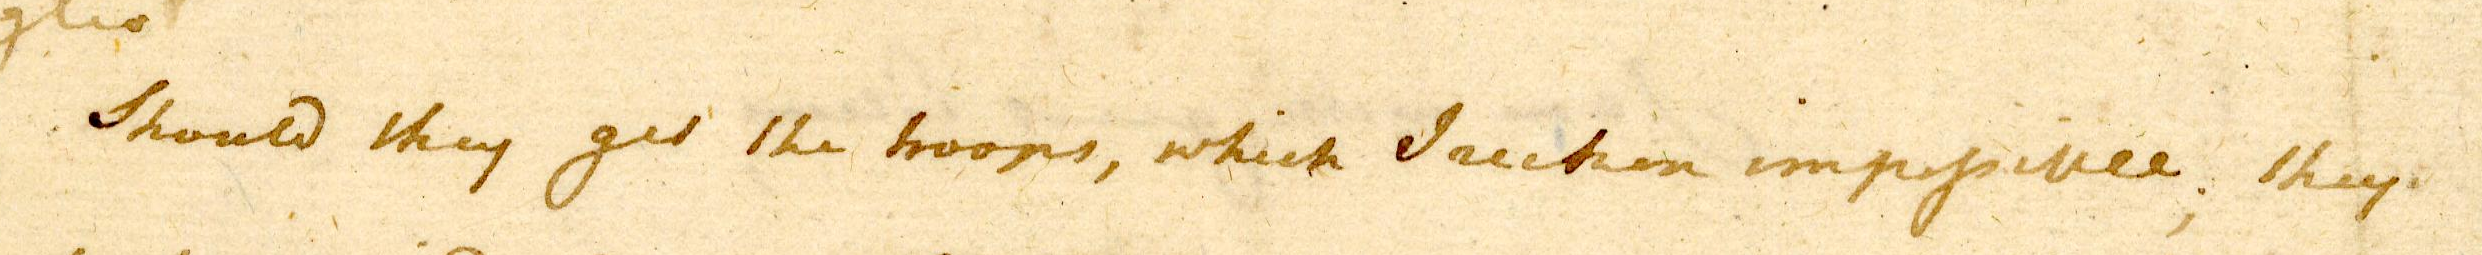should they get the troops, which I reckon impossible. they
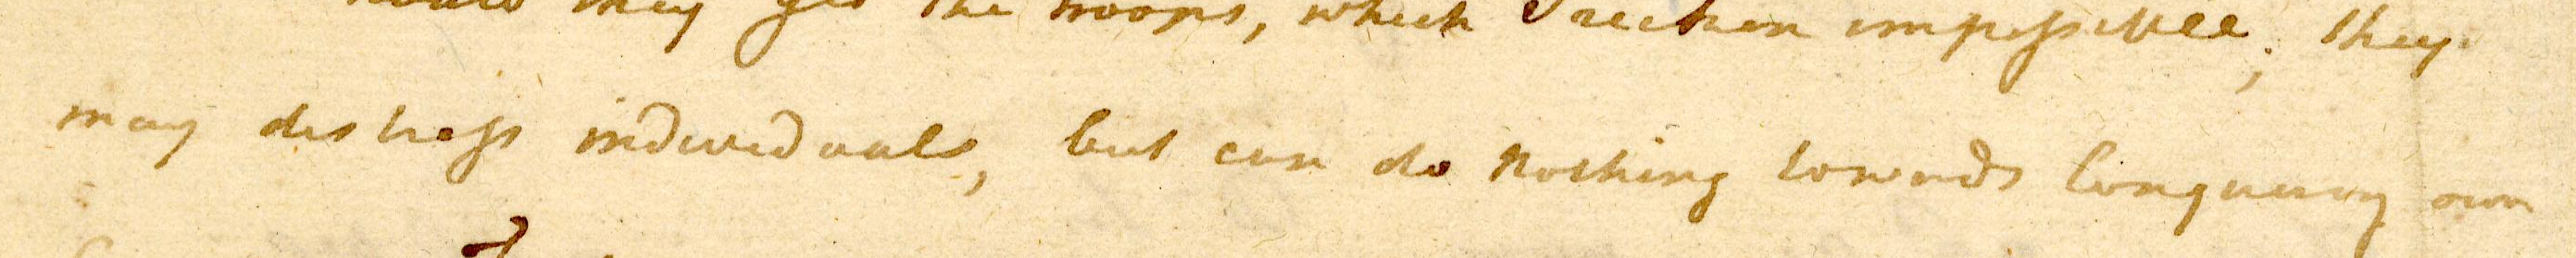may distress individual but can do nothing towards long ways our
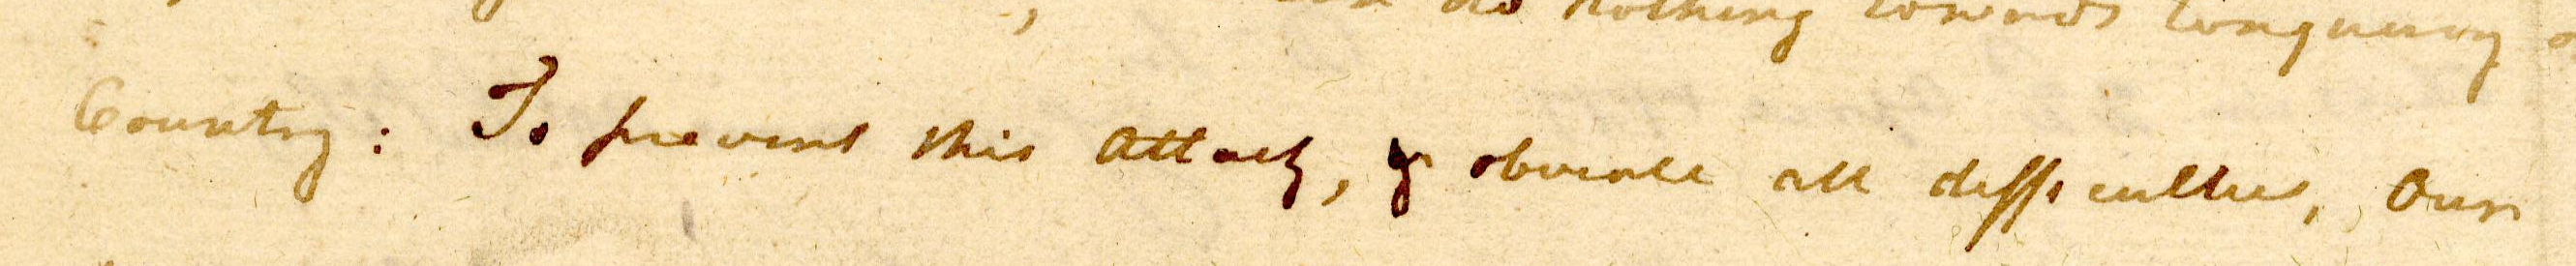Country: To prevent this attack, & obvate all difficulties, our
